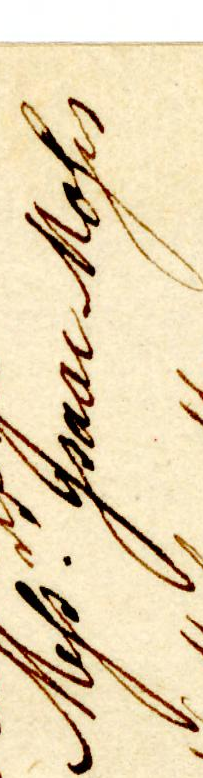Mess^rs Isaac Moses
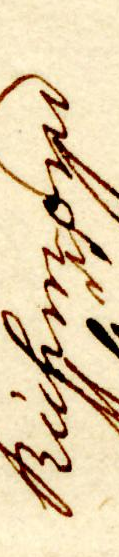Richmond
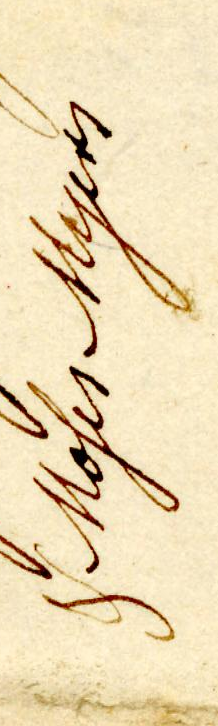& Moses Myers
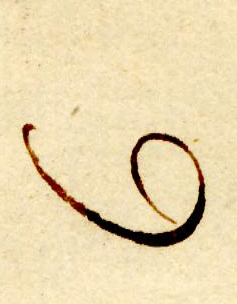6
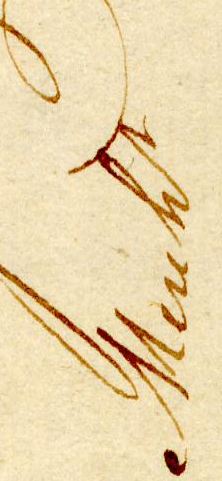Merch^t
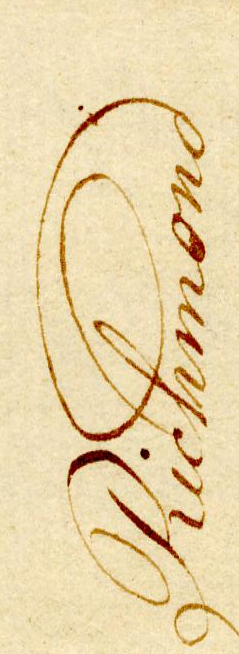Richmond
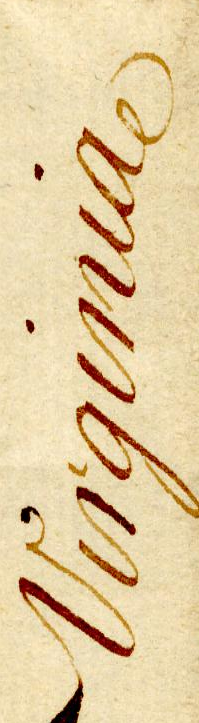Virginia
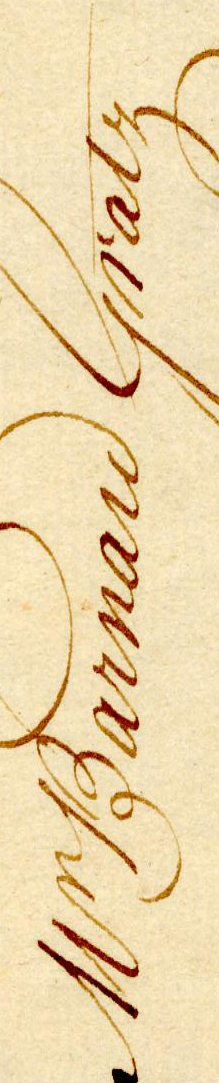M^r Barnard Gratz
